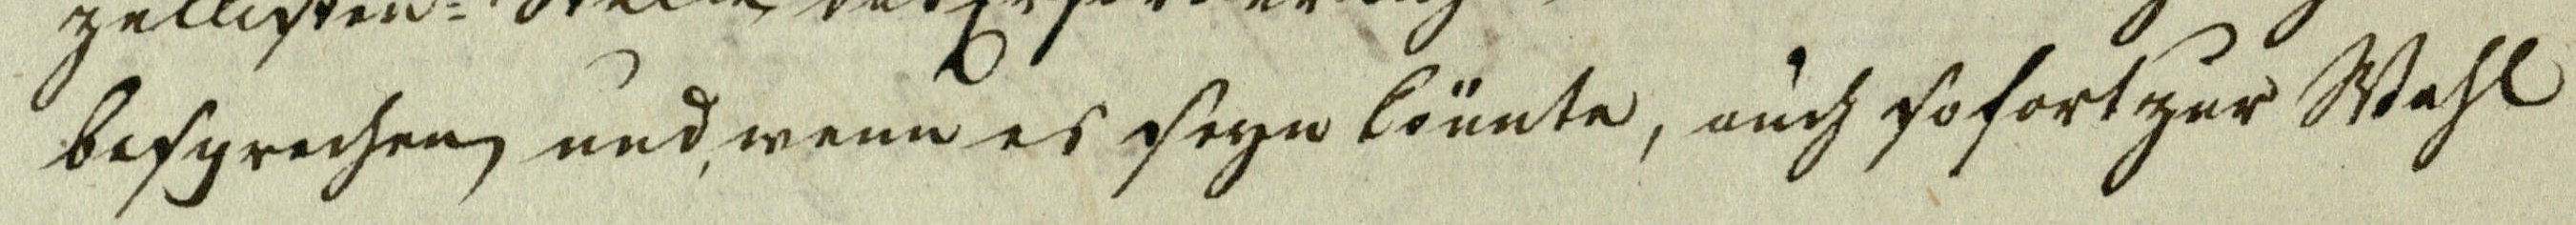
besprechen und wenn es seyn könnte, auch sofort zur Wahl
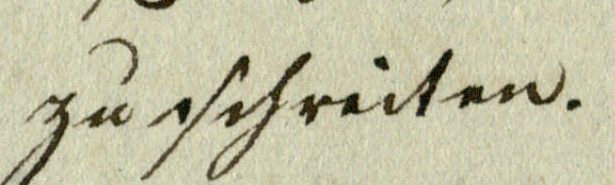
zu schreiten.
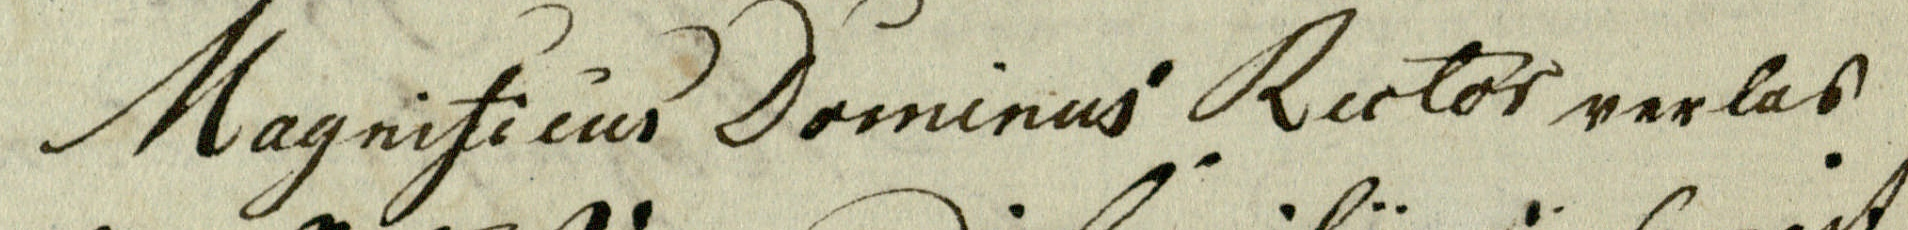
Magnificus Dominus Rector verlas
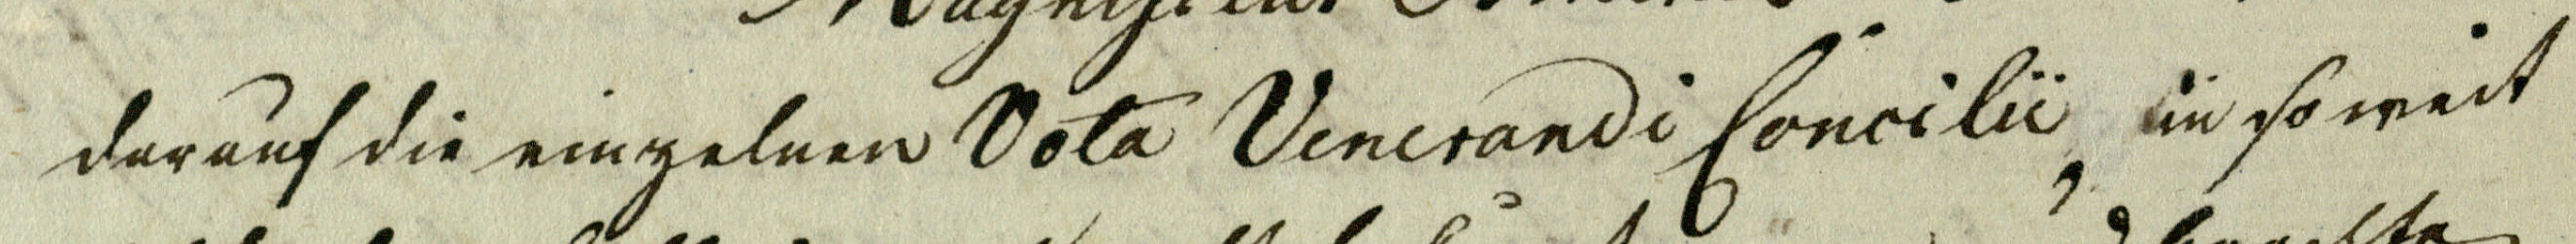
darauf die einzelnen Vota venerandi Concilii insoweit
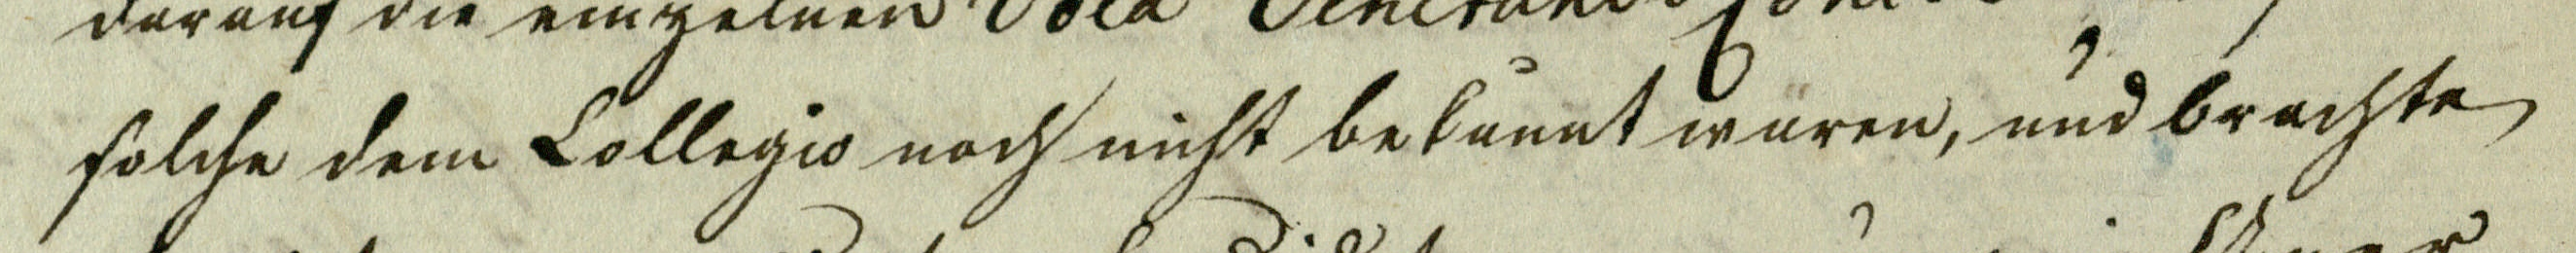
solche dem Collegio noch nicht bekannt waren, und brachte
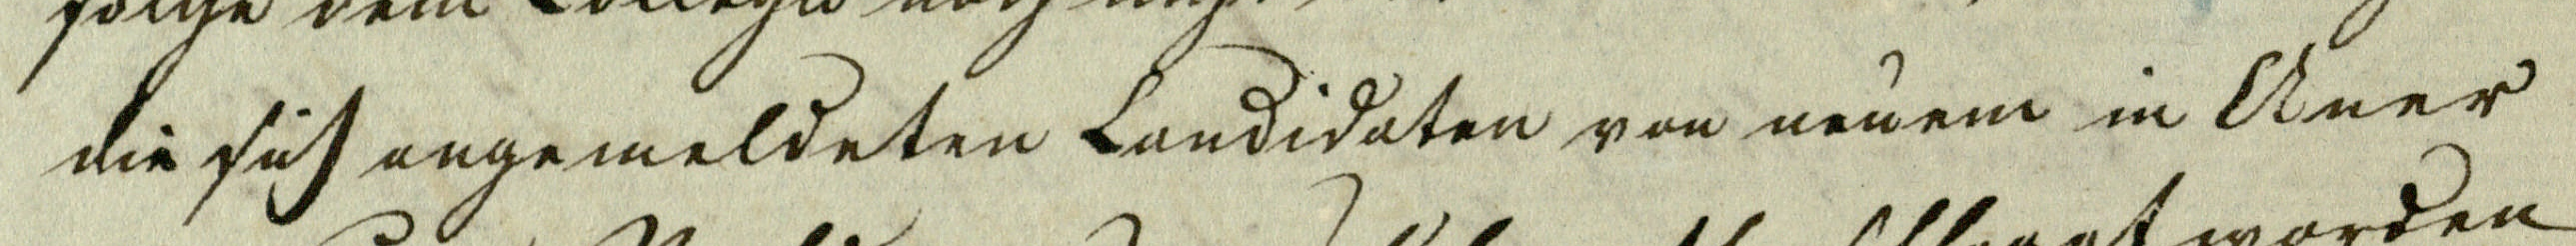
die sich angemeldeten Candidaten von neuem in Aner¬
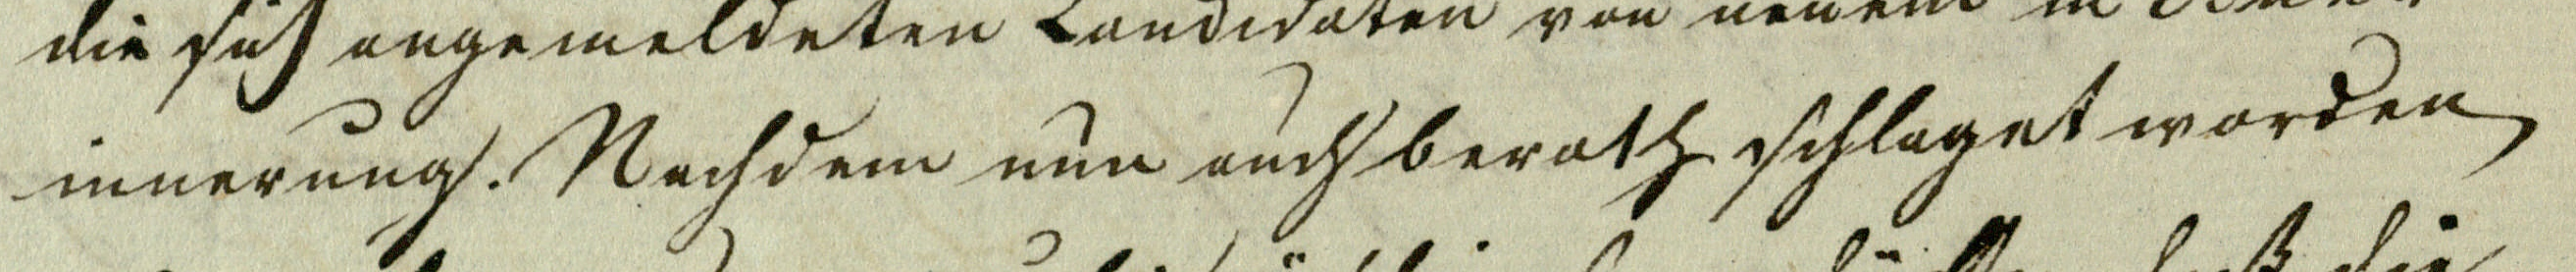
innerung . Nachdem nun auch berathschlaget worden
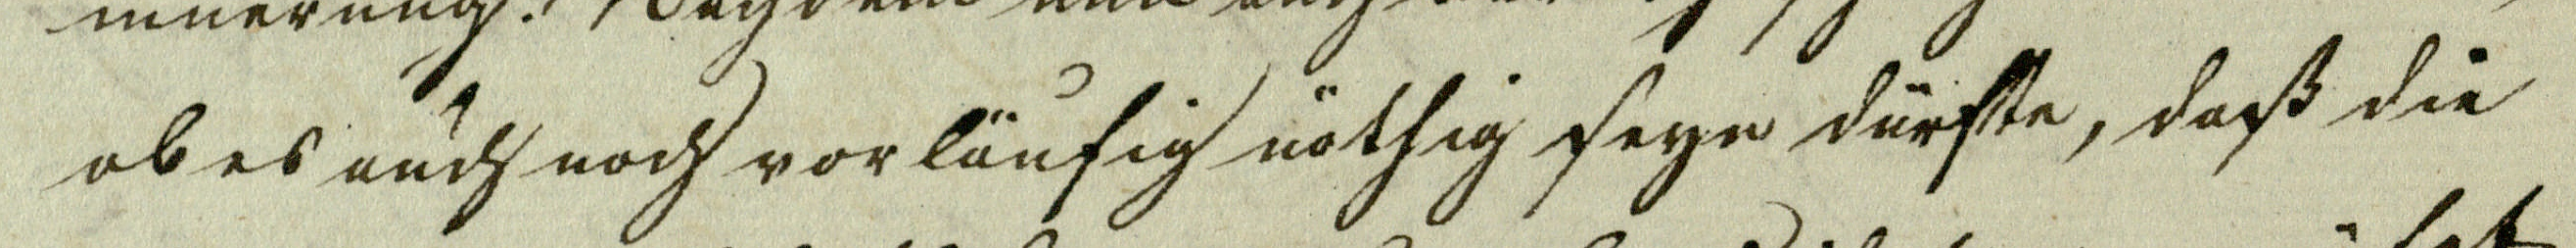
ob es auch noch vorläufig nöthig seyn dürfte, daß die
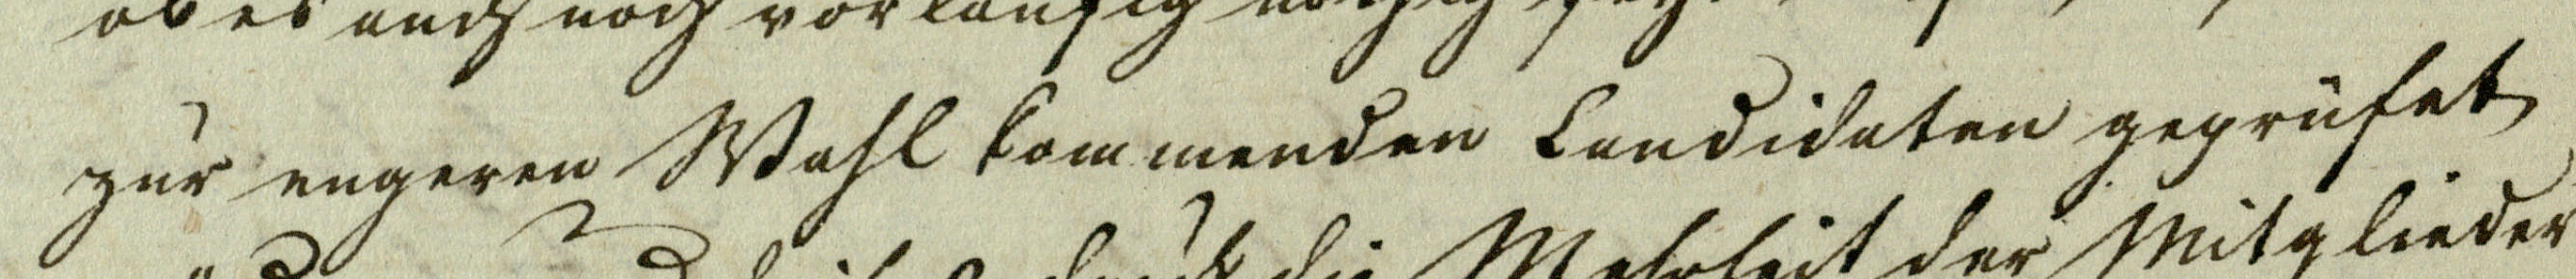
zur engeren Wahl kommenden Candidaten geprüfet
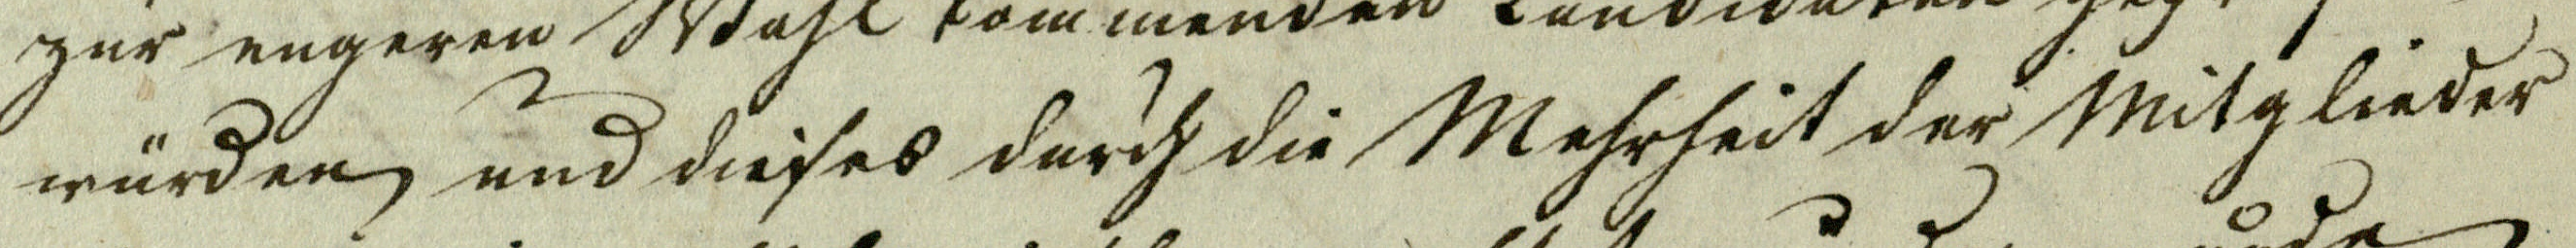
würden, und dieses durch die Mehrheit der Mitglieder
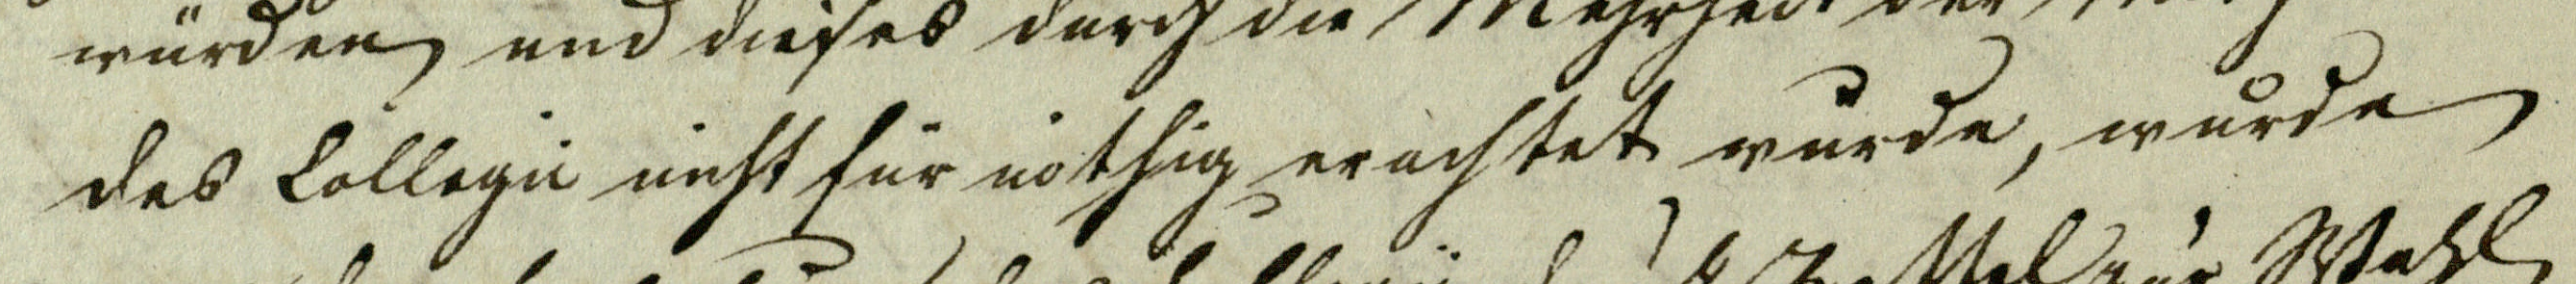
des Collegii nicht für nöthig erachtet würde, wurde
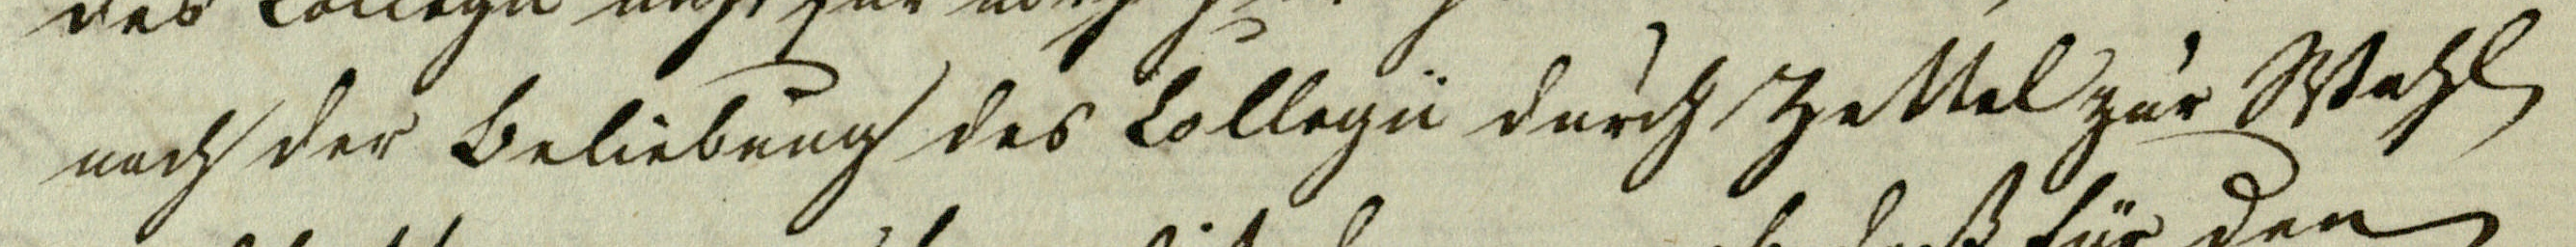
nach der Beliebung des Collegii durch Zettel zur Wahl
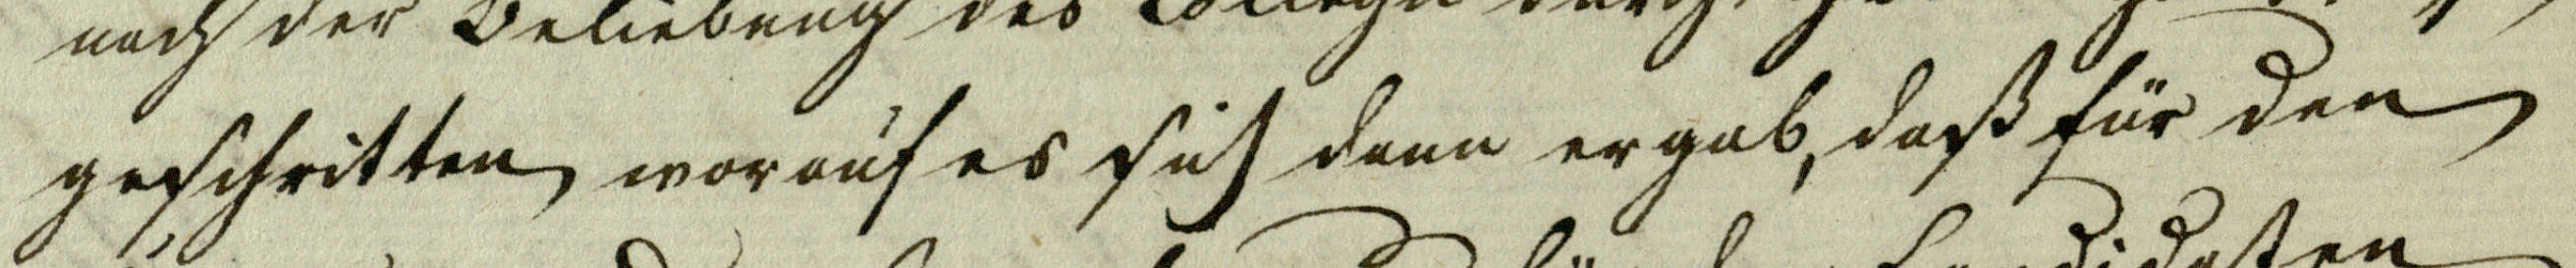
geschritten worauf es sich dann ergab, daß für den
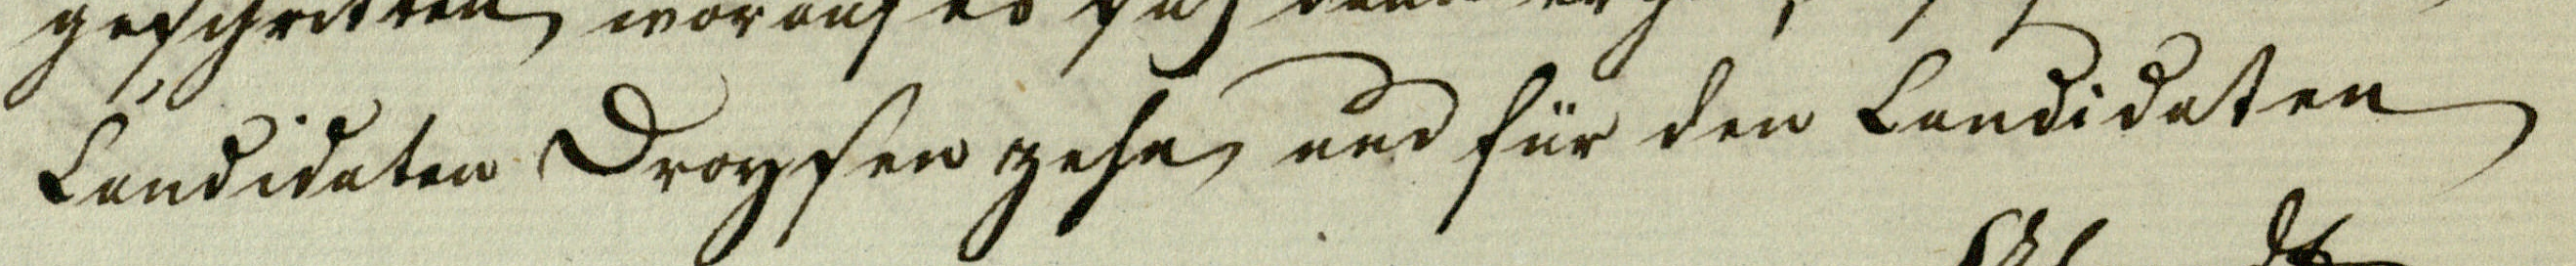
Candidaten Droysen zehn und für den Candidaten
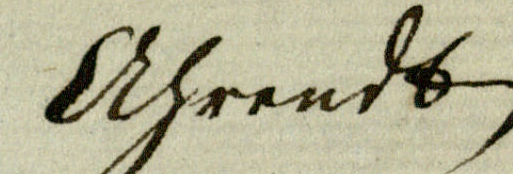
Ahrendt
